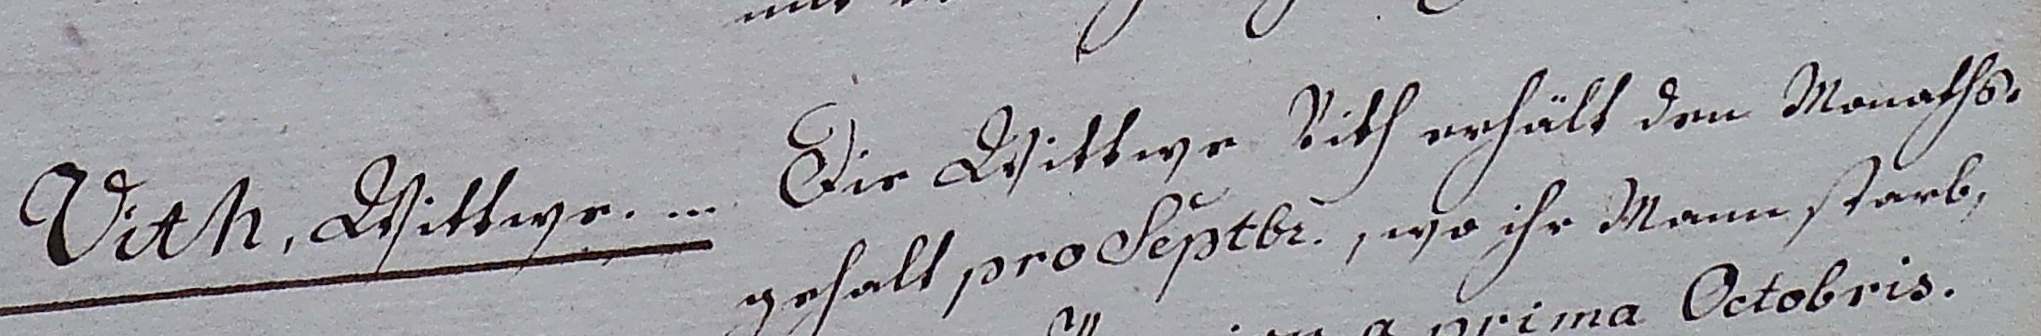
Vith, Wittwe. ... Die Wittwe Vith erhält den Monaths¬
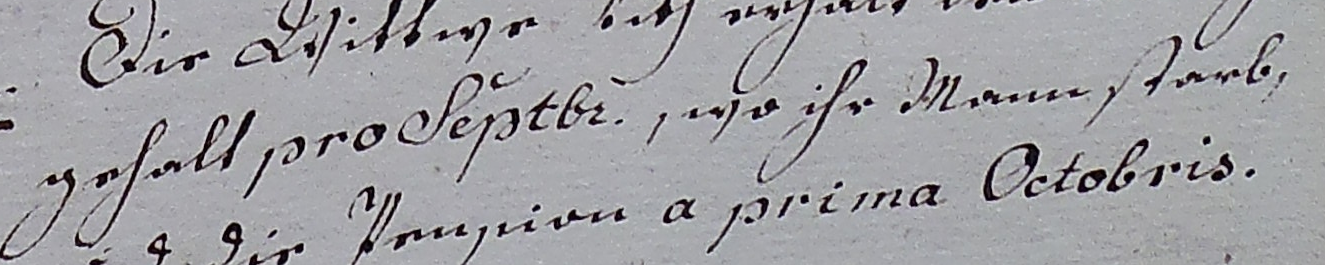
gehalt pro Septbr., wo ihr Mann starb,
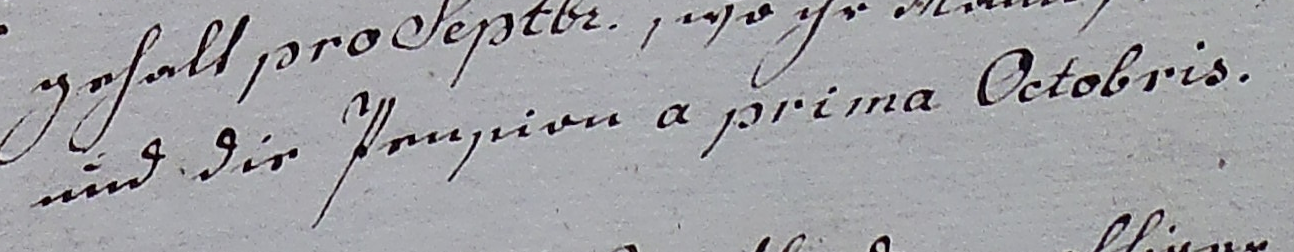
und die Pension a prima Octobris.
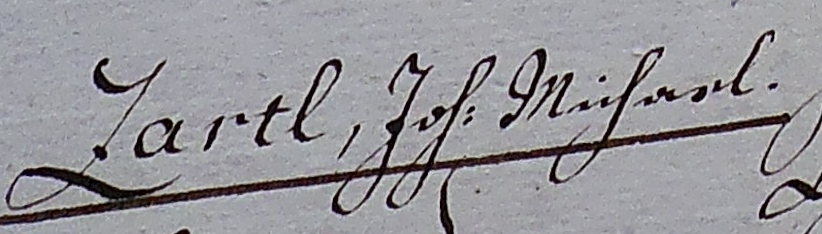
Zartl, Joh: Michael.
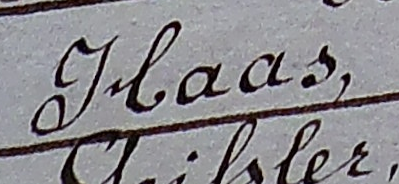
Haas,
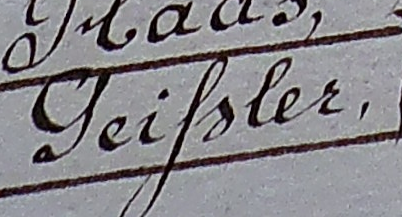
Geissler.
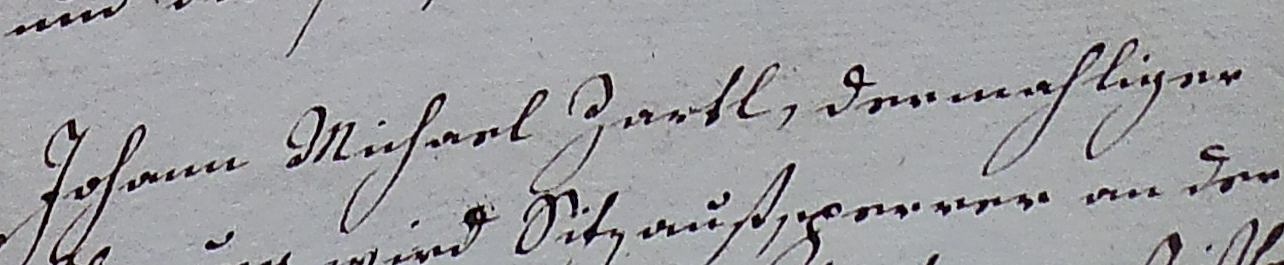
Johann Michael Zartl, dermahliger
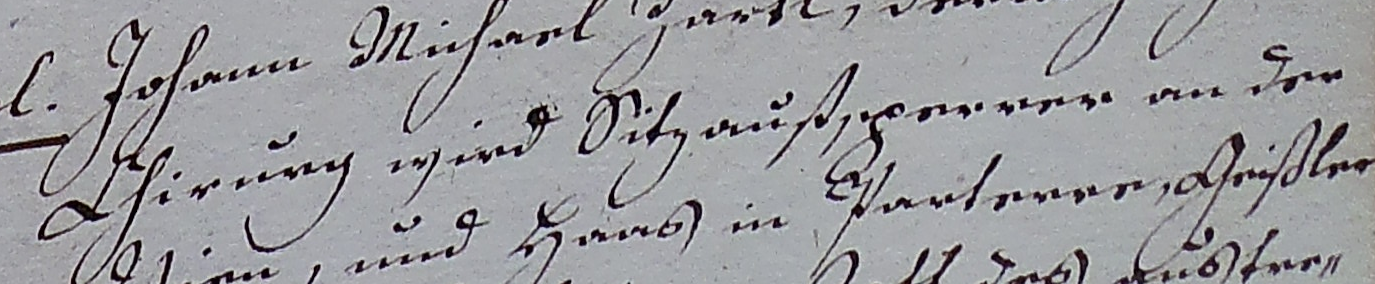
Chirurg wird Sitzaufsperrer an der
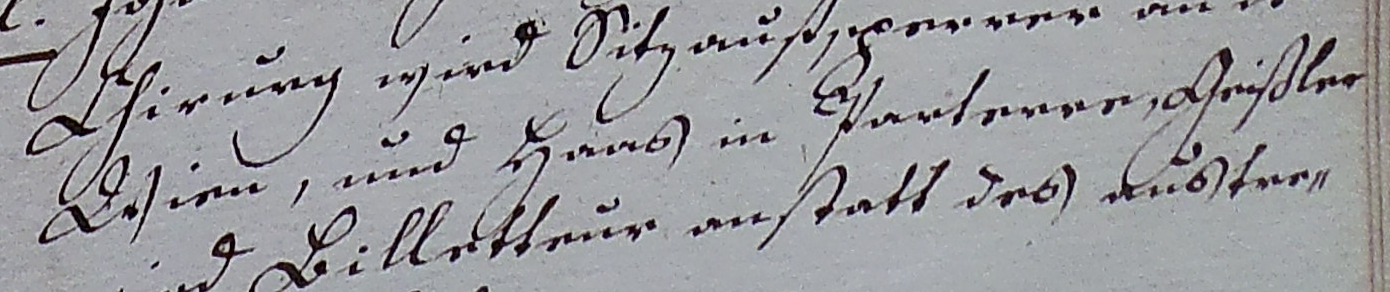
Wien, und Haas in Parterre Geißler
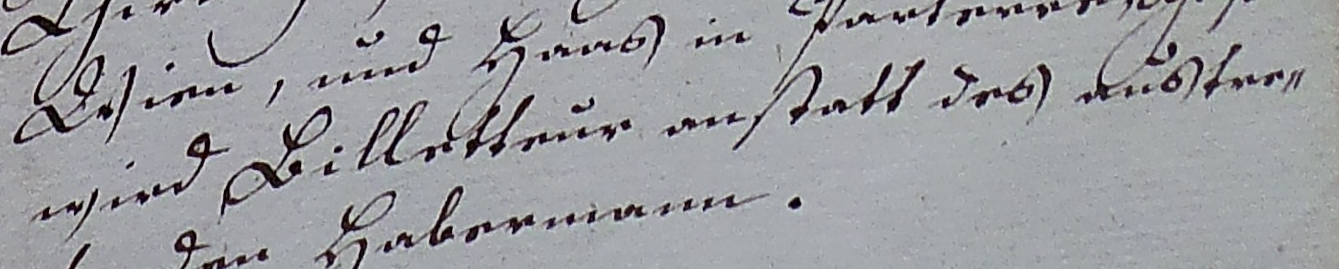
wird Billetteur anstatt des austre¬
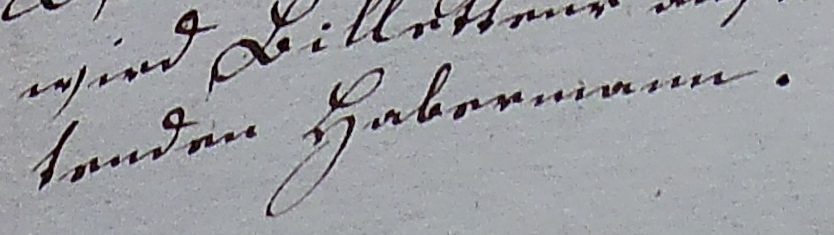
tenden Habermann.
